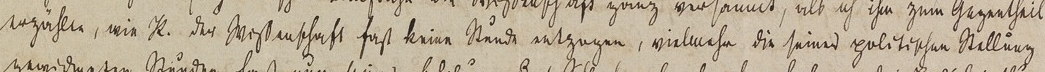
erzählte, wie K. der Wissenschaft fast keine Stunde entzogen, vielmehr die seiner politischen Stellung
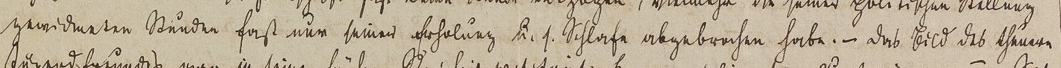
gewidmeten Stunden fast nur seiner Erholung u. s. Schlafe abgebrochen habe. – Das Bild des theuern
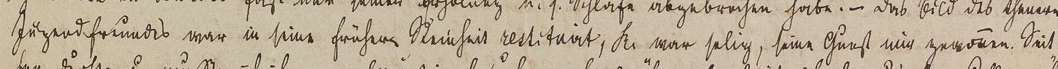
Jugendfreundes war in seine frühere Reinheit restituirt, R. war selig, seine Gunst mir gewonnen. Seit-
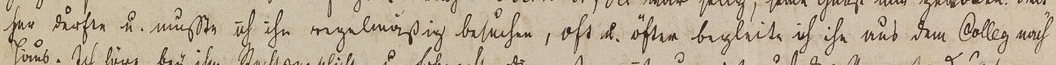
her durfte u. mußte ich ihn regelmäßig besuchen, oft u. öfter begleite ich ihn aus dem Colleg nach
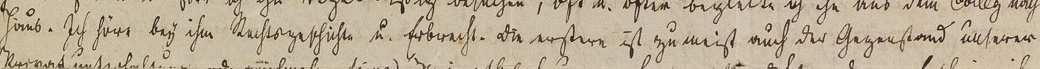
Haus. Ich höre bey ihm Rechtsgeschichte u. Erbrecht. Die erstere ist zumeist auch der Gegenstand unserer
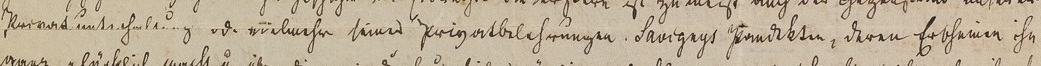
Privatunterhaltung od. vielmehr seiner Privatbelehrungen. Savignys Pandekten, deren Erscheinen ihn
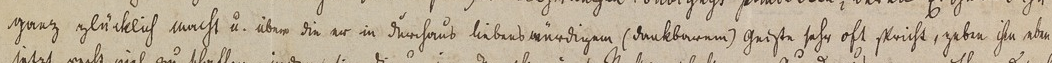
ganz glücklich macht u. über die er in durchaus liebenswürdigem (dankbarem) Geiste sehr oft spricht, geben ihm eben
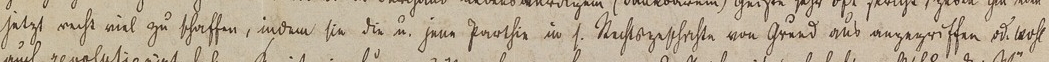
jetzt recht viel zu schaffen, indem sie die u. jene Parthie in s. Rechtsgeschichte von Grund aus angegriffen od. wohl
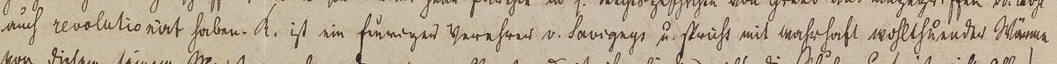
auch revolutionirt haben. R. ist ein feuriger Verehrer v. Savignys u. spricht mit wahrhaft wohlthuender Wärme
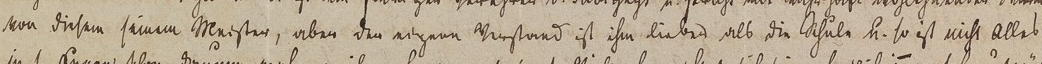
von diesem seinem Meister, aber der eigene Verstand ist ihm lieber als die Schule u. so ist nicht Alles
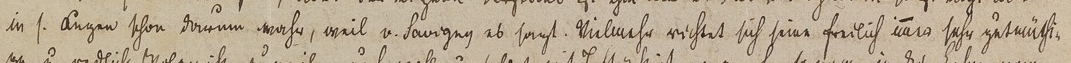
in s. Augen schon darum wahr, weil v. Savigny es sagt. Vielmehr richtet sich seine freilich immer sehr gutmüthi-
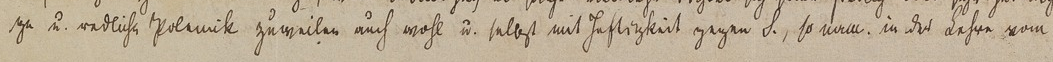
ge u. redliche Polemik zuweilen auch wohl u. selbst mit Heftigkeit gegen S., so nam. in der Lehre vom
